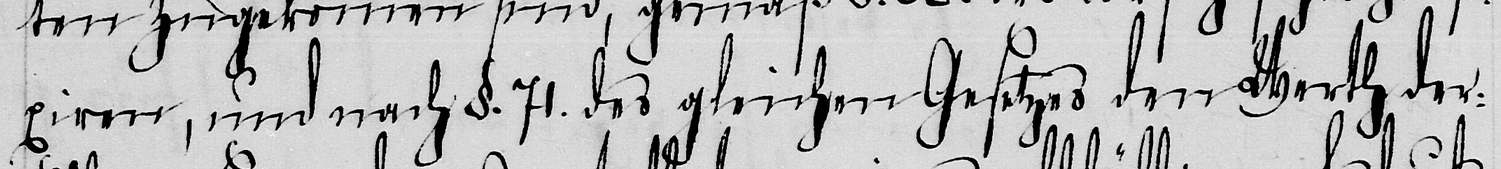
xiren, und nach §. 71. des gleichen Gesetzes den Werth der¬
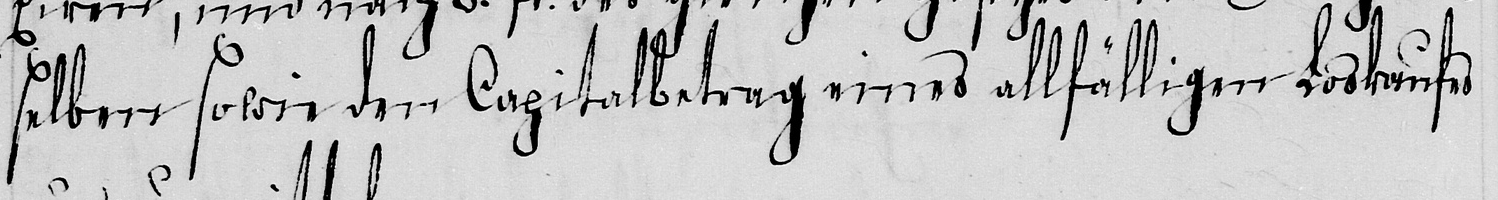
selben sowie den Capitalbetrag eines allfälligen Loskaufes
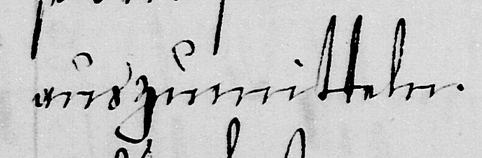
auszumitteln.
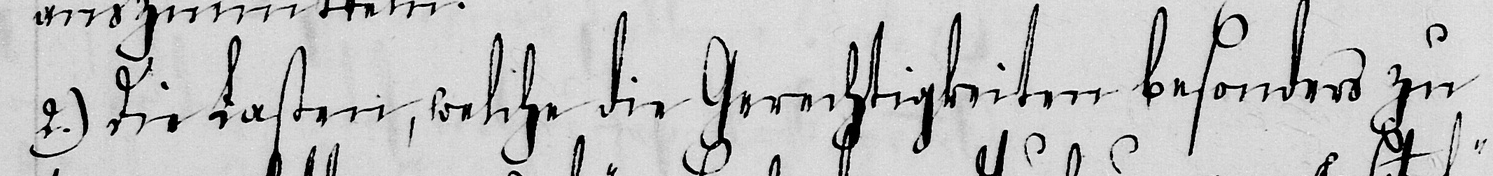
2.) Die Lasten, welche die Gerechtigkeiten besonders zu
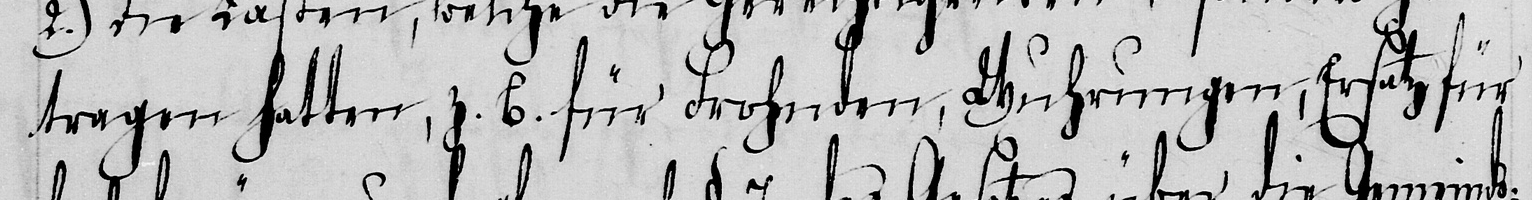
tragen hatten, z.B. für Frohnden, Wuhrungen, Ersatz für
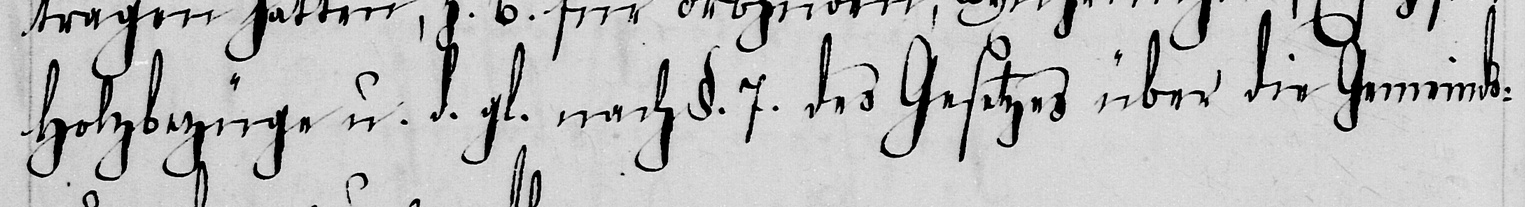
Holzbezüge u. d. gl. nach §. 7. des Gesetzes über die Gemeind¬
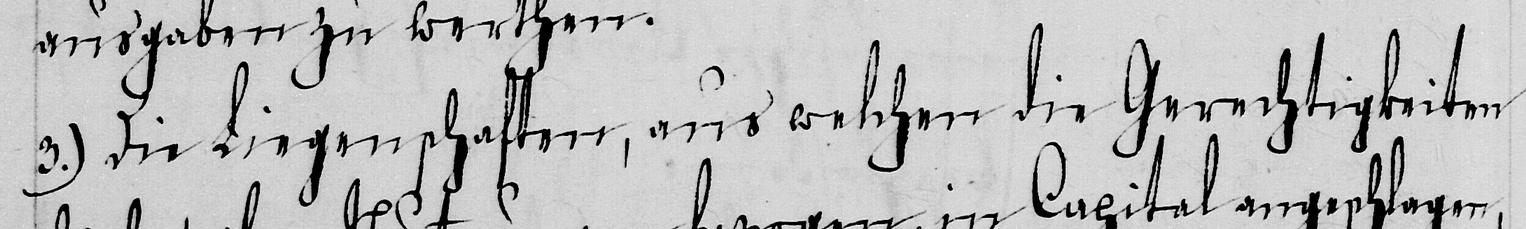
3.) Die Liegenschaften, aus welchen die Gerechtigkeiten
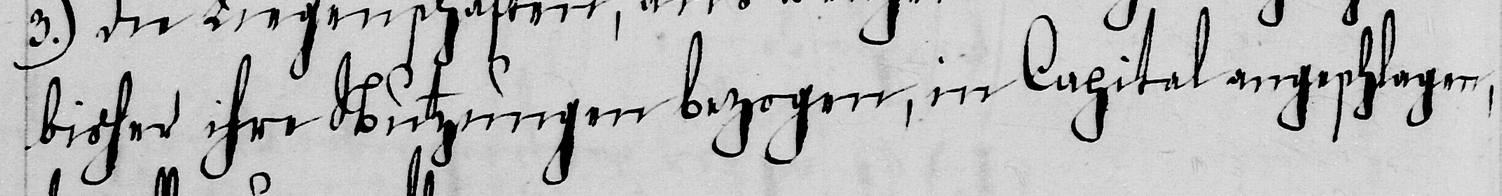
bisher ihre Nutzungen bezogen, in Capital angeschlagen,
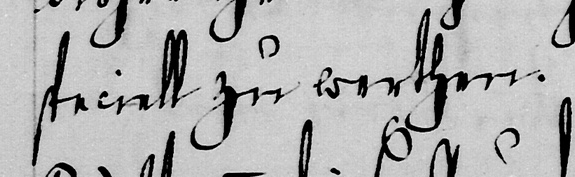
speciell zu werthen.
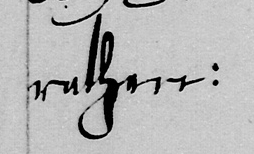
rathen:
